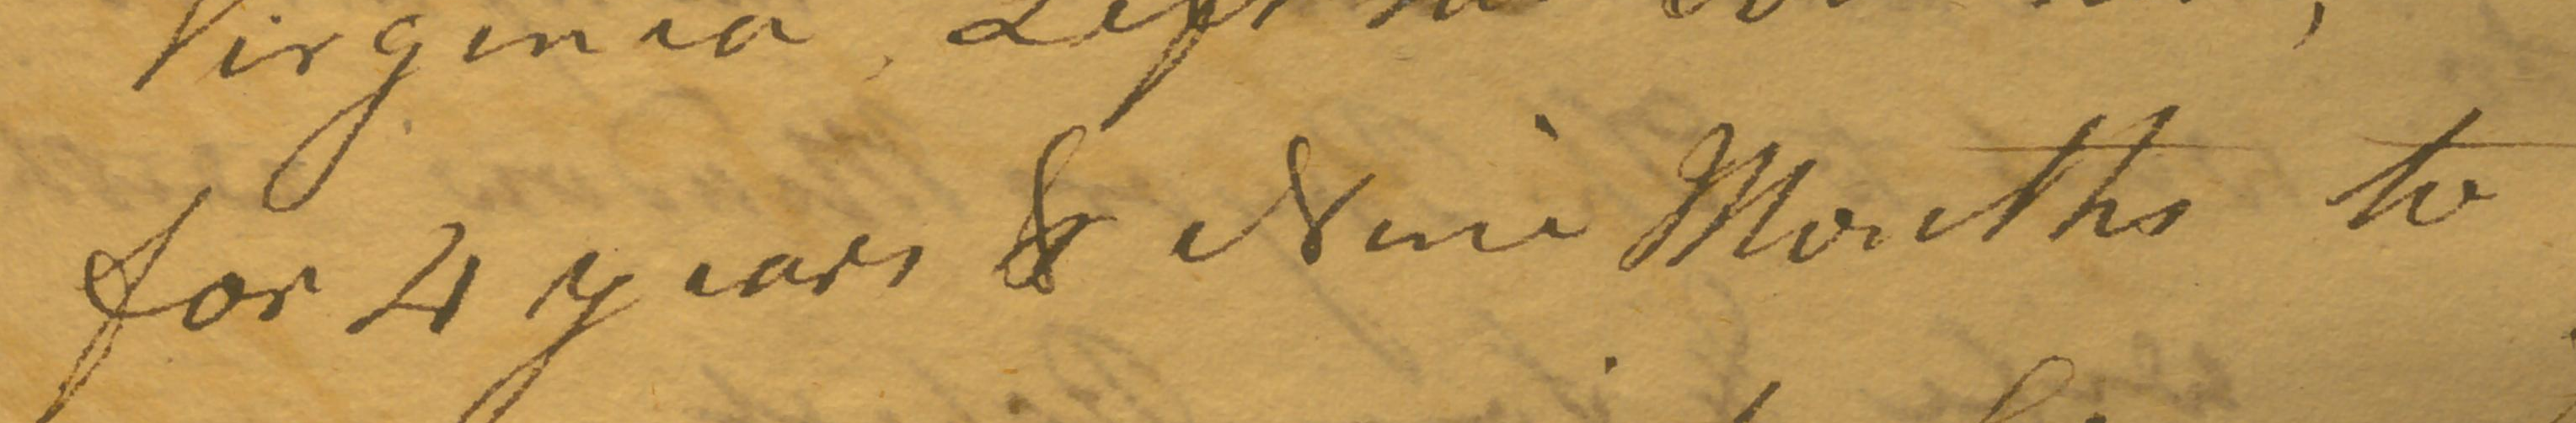for 4 years & Nine Months to
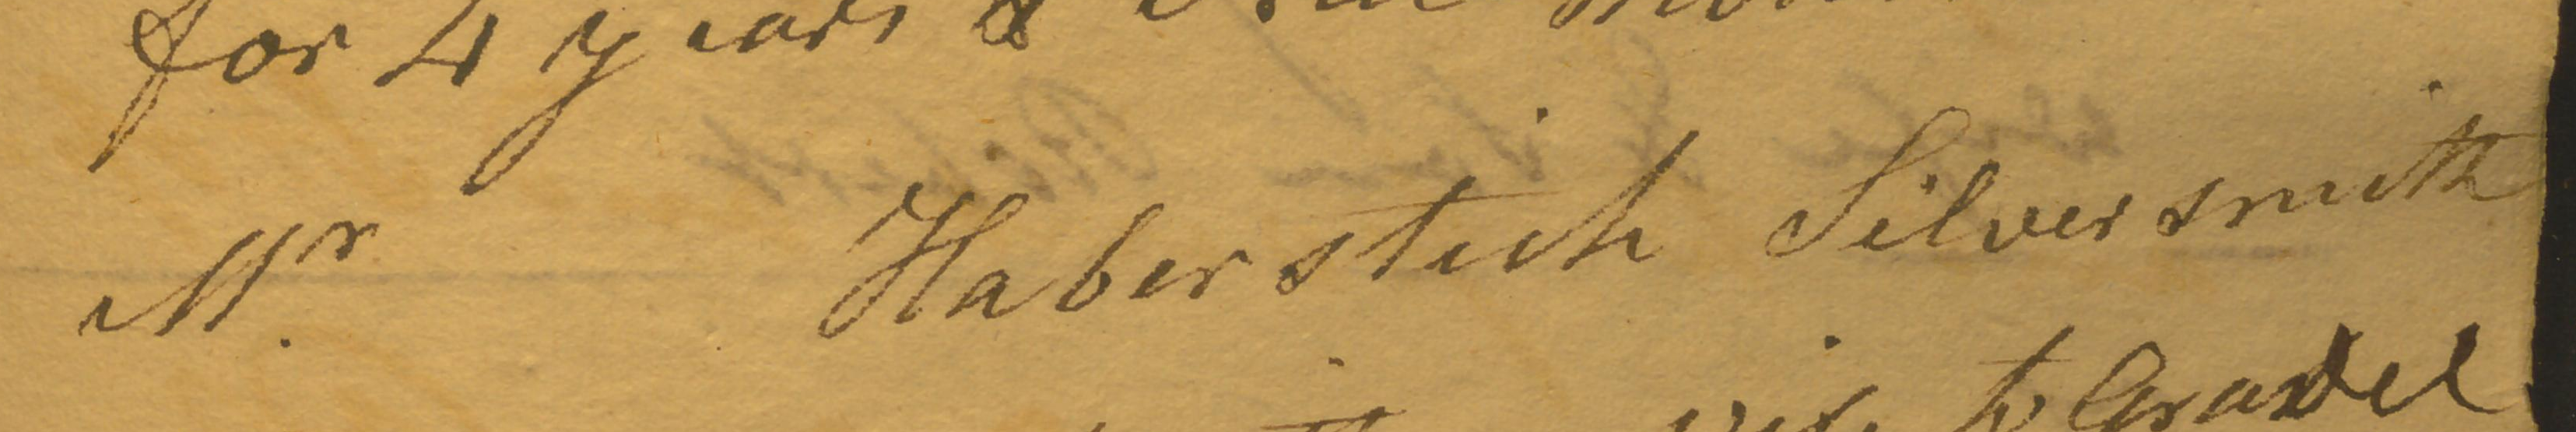M^r. Haberstich Silversmiith
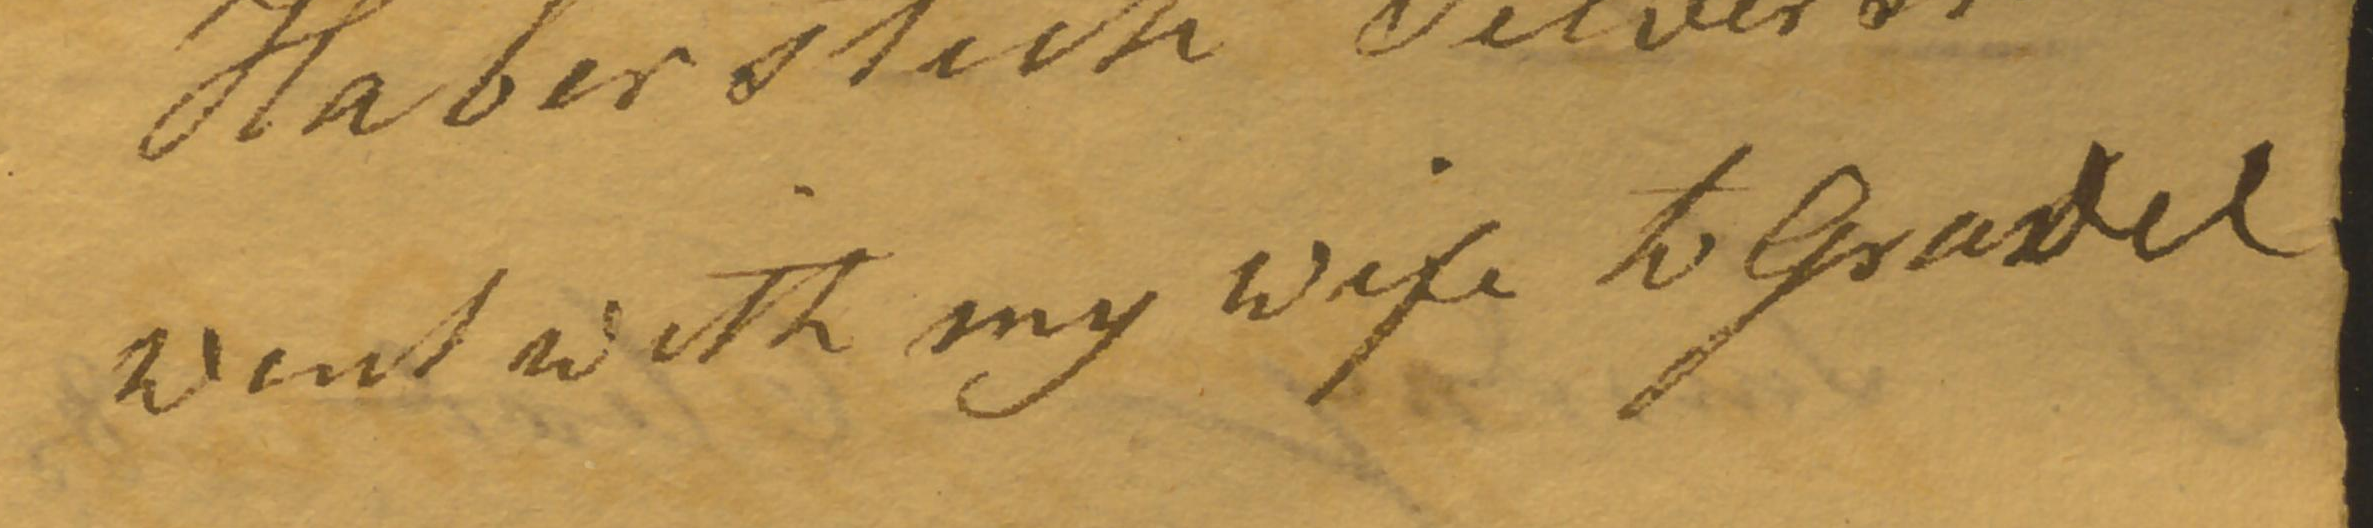went with my wife to Gravel
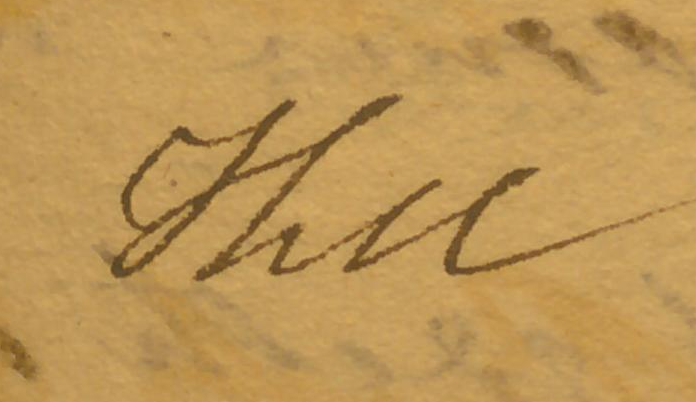Hill
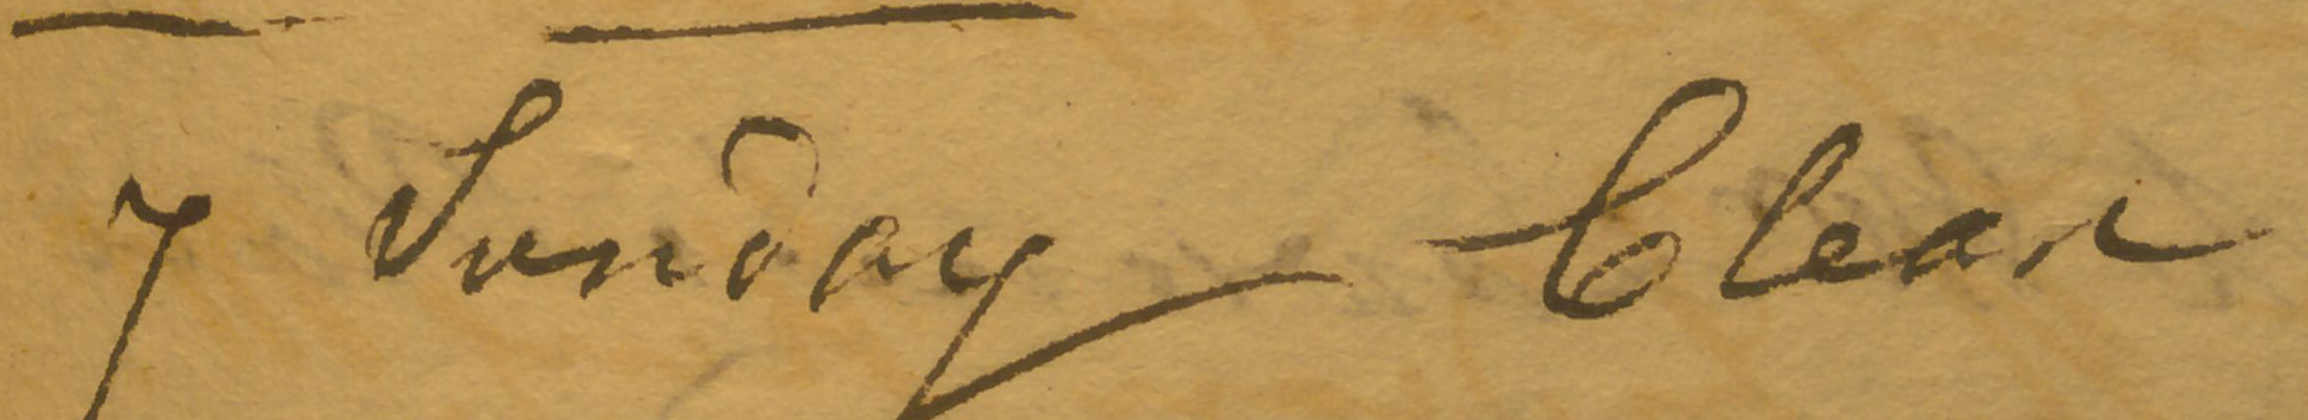7 Sunday Clear
